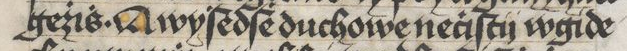geżíṡ.A wyẛedẛe duchowé neċiſtij wgide¬
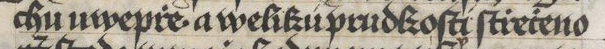chu u wepṙe.a welikú prudkoſti ſtṙeċeno
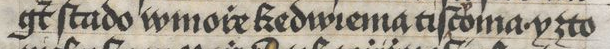ḡt ſtado w moṙe ke dwiema tiſcovma.y zto¬
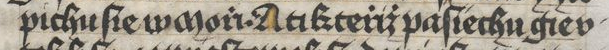pichu ſie wo Moṙi.A ti kteṙíż paſíechu gie v¬
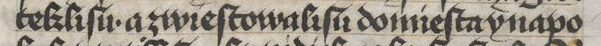tekli ſu.a zwieſtowaliſu domieſta y napo¬
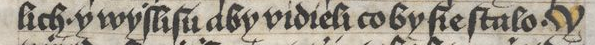lich.y wyẛli ſu aby vidieli co by ſie ſtalo.Y
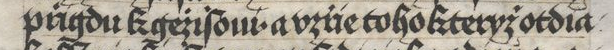pṙigdu k geżíẛoui a uzṙíe toho kteryž ot dia¬
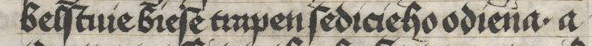belſtuie bíeẛe trapen ſedícíeho odiena.a
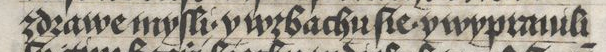zdrawe myſli.y wzbachu ſie.y wyprauili
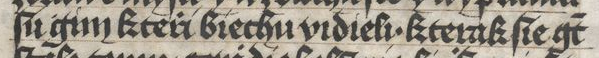ſu gim kteṙí bíechu vidieli.kterak ſie ḡt
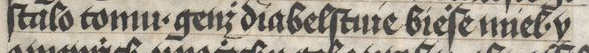ſtalo tomu.genż diabelſtuíe bíeẛe miel.y
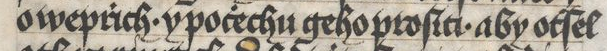o wepṙich.y poċechu geho proſiti.aby otẛel
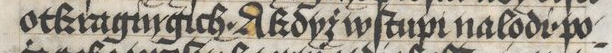ot kragugích.A kdyż wſtupi na lodi po¬
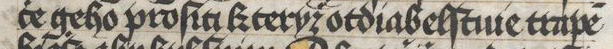ċe geho proſiti kteryž ot diabelſtuíe trapē
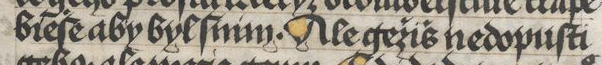bíeẛe aby byl ſnim. Ale gežíš nedopuſti
